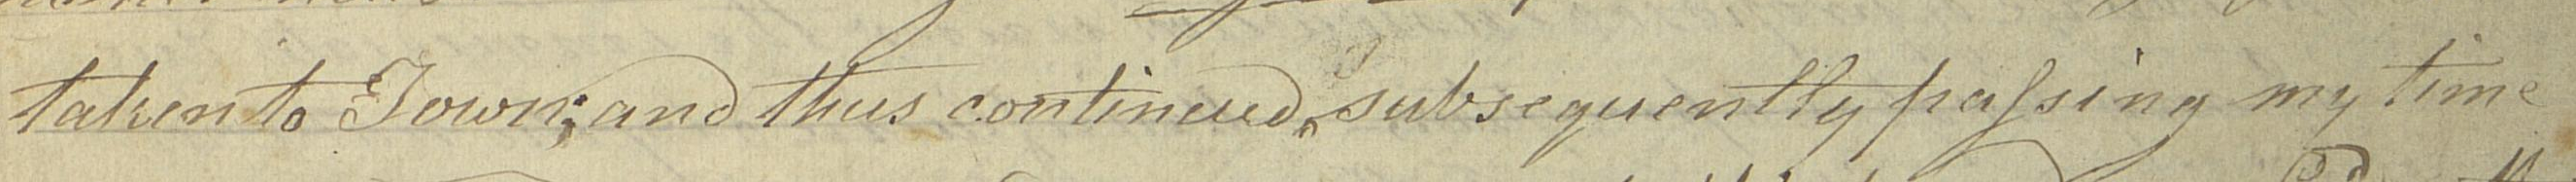taken to Town; and thus continued, subsequently passing my time
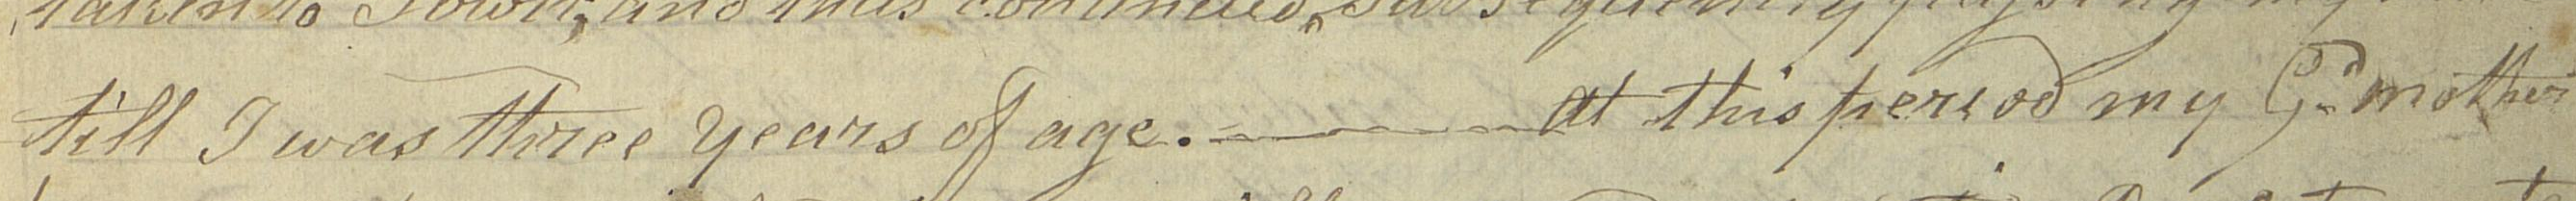till I was three years of age. At this period my G^d. mother
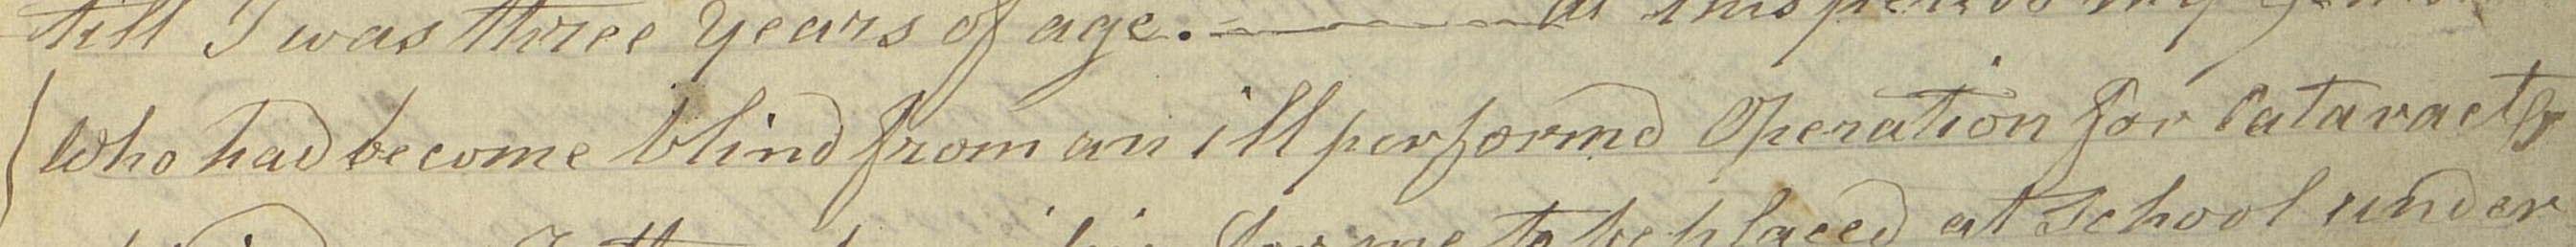(who had become blind from an ill performd operation for Cataracts
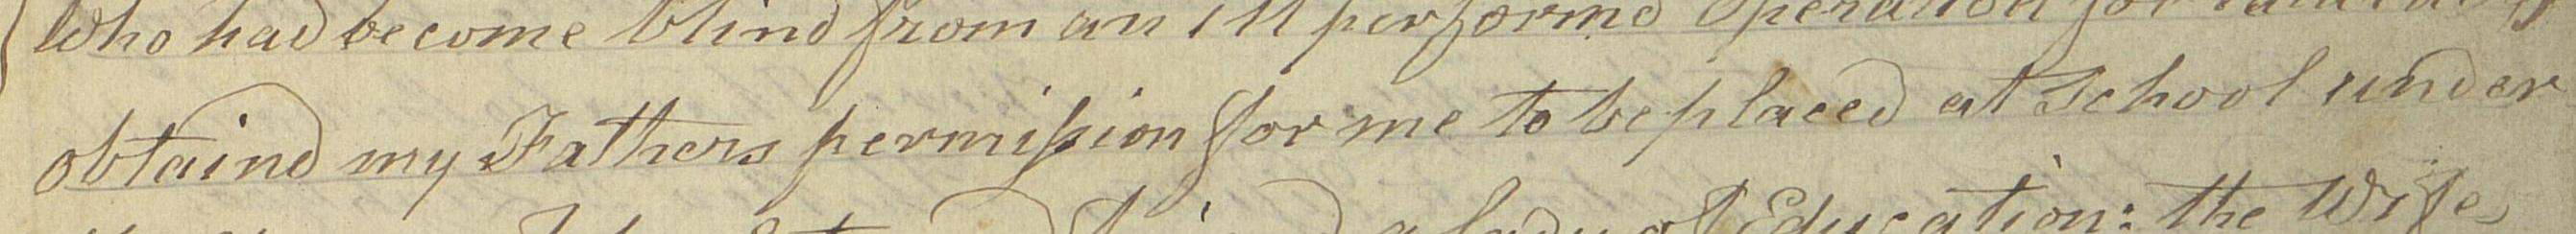obtaind my Fathers permission for me to be placed at School under
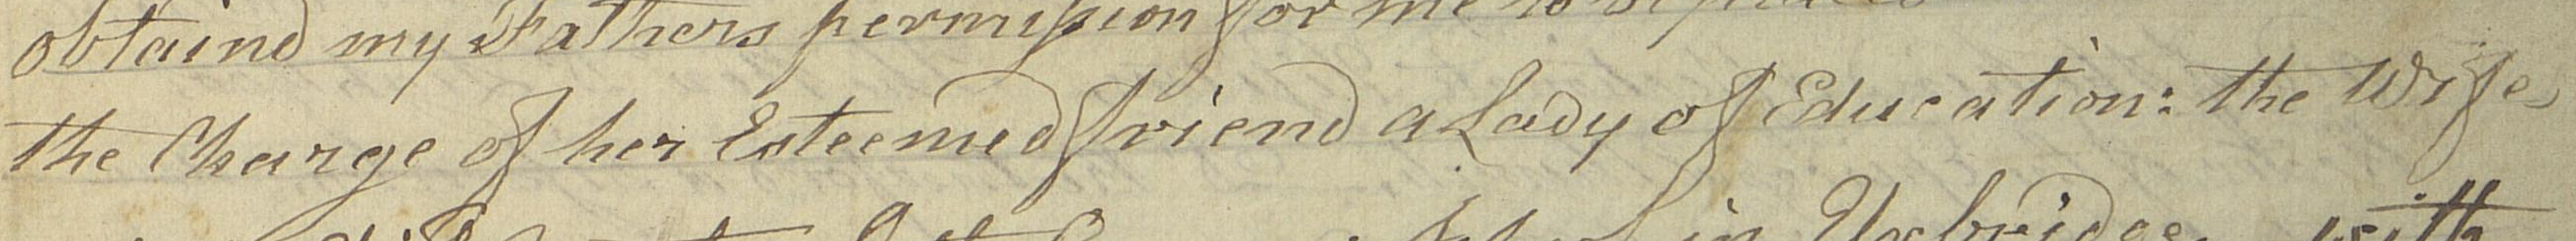the Charge of her Esteemed friend a Lady of Education: the Wife,
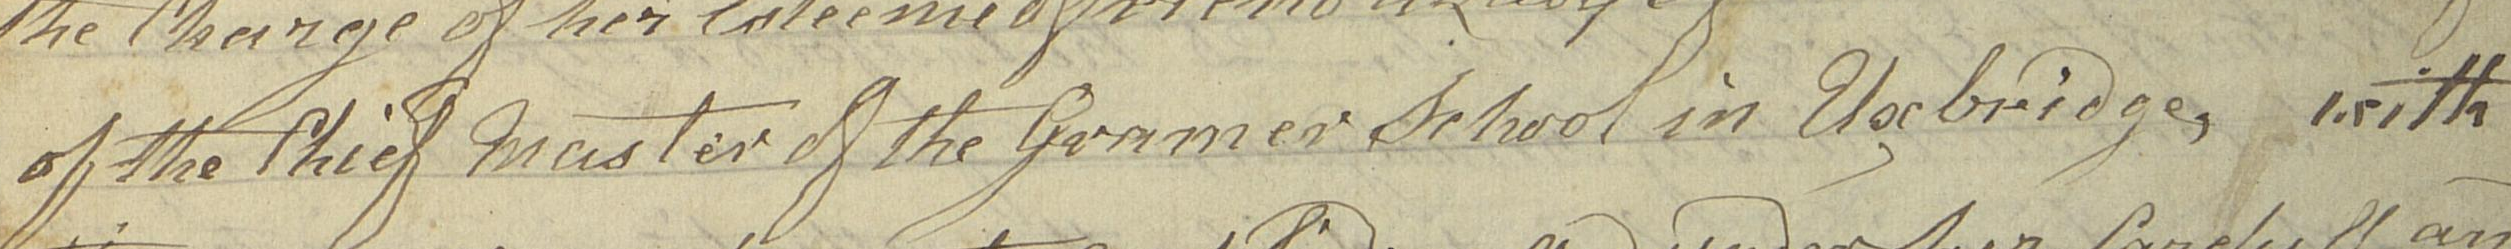of the Chief Master of the Grammer School in Uxbridge, with
